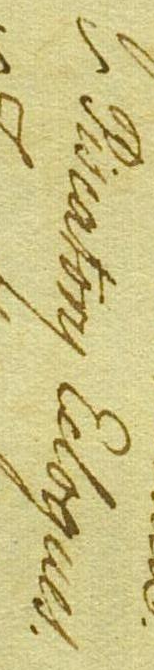- Piscatory Eclogues.
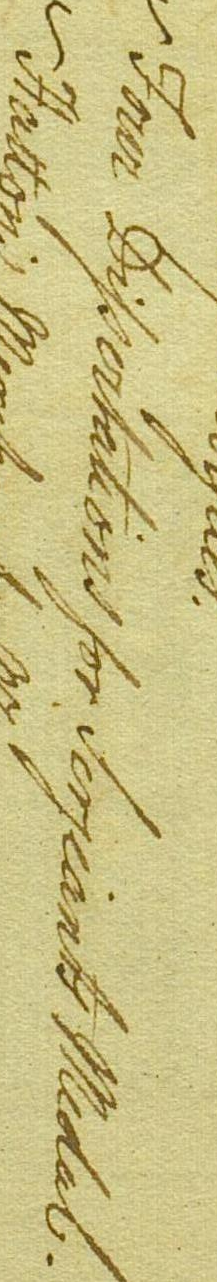- Four Dissertations for Serjeants Medal.
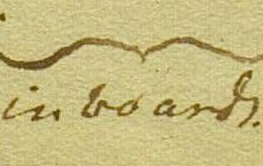in boards.
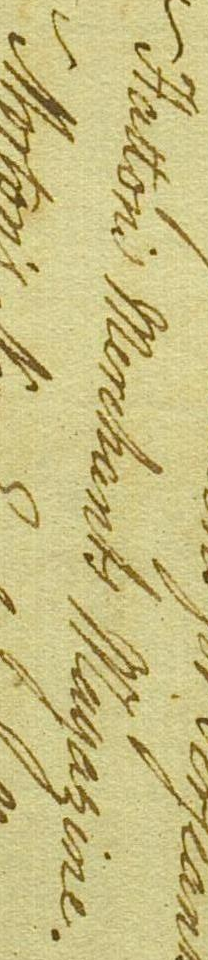- Hatton's Merchants Magazine.
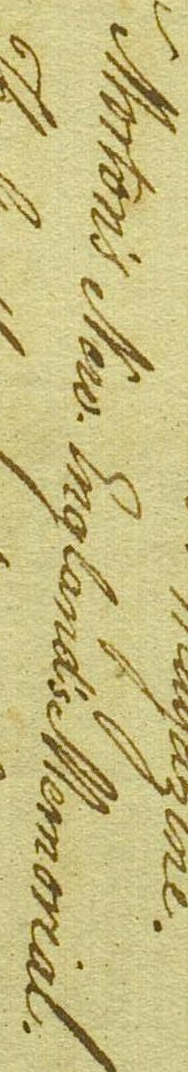- Morton's New. England's Memorial.
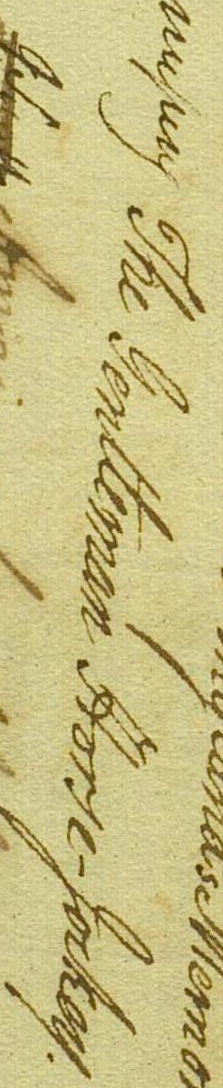nupery The Gentleman Horse-Jockey.
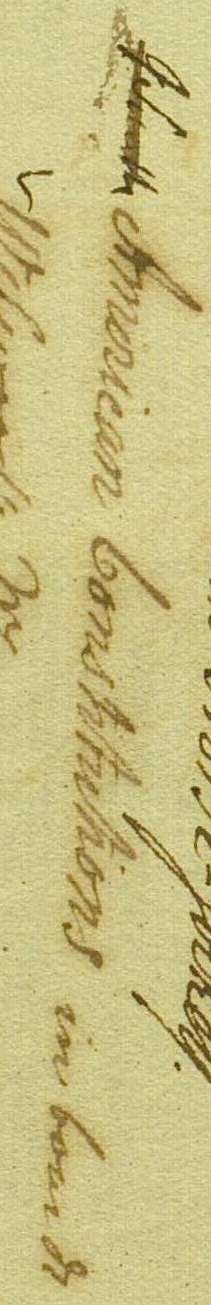[___] American Constitutions in boards
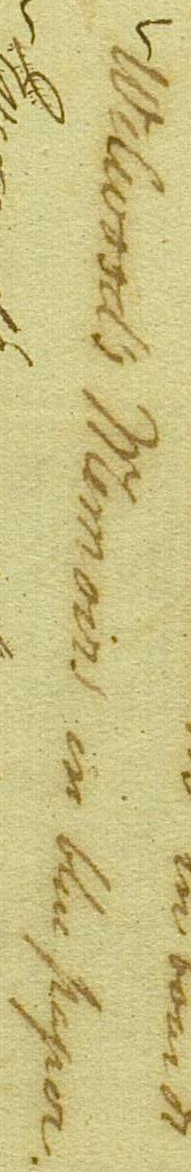- Welwood's Memoirs in blue paper.
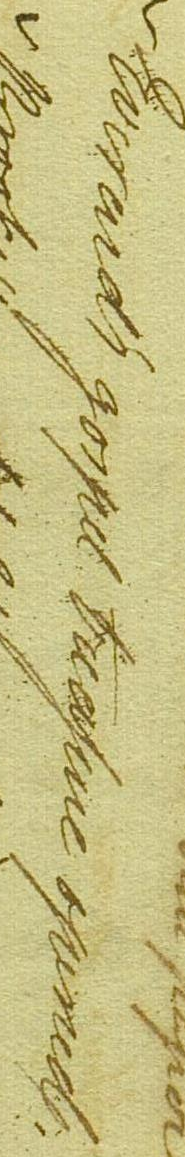- Everard's gospel treasure opened.
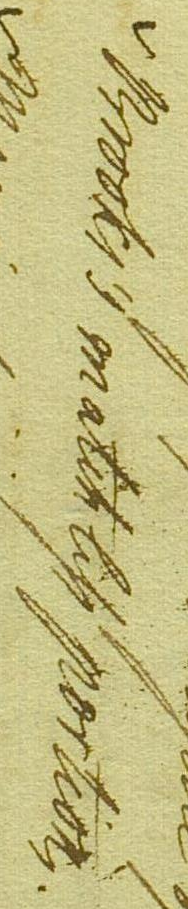- Brooks's matchless portion.
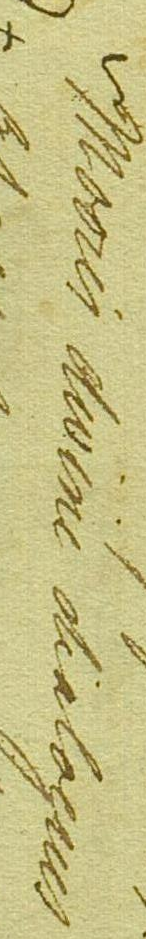- Moore's divine dialogues
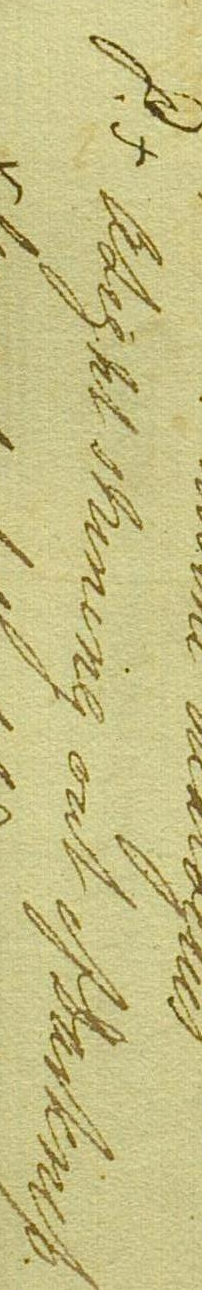P.t Light shining out of Darkness.
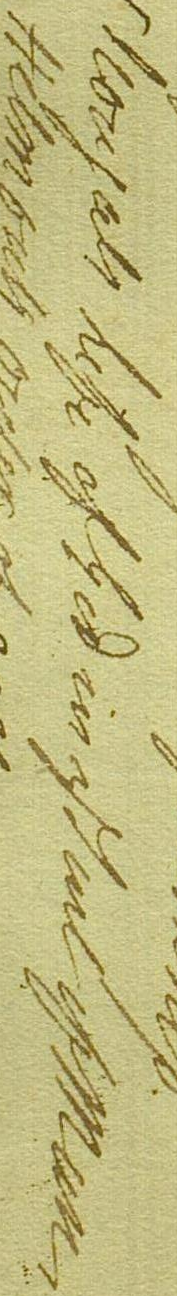- Scougals Life of God in y^e Soul of Man
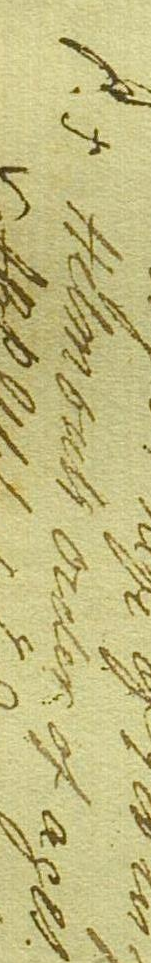[__] Helmouls order of ages.
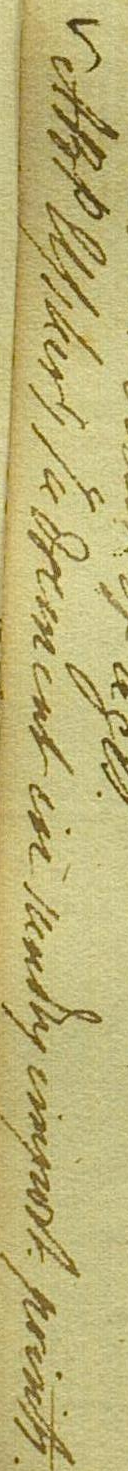- ARP Esskers Judgement in sundry import. prints.
